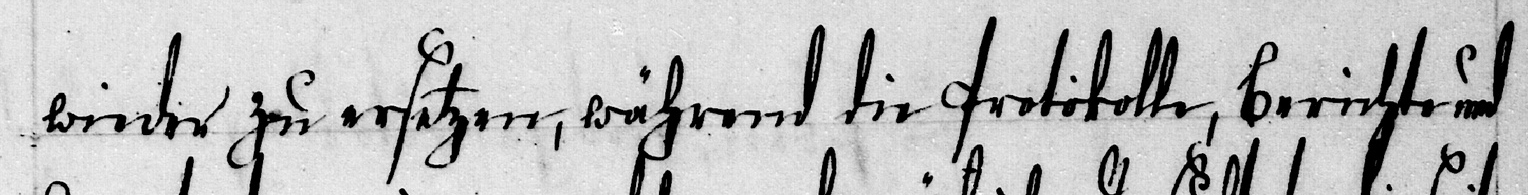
wieder zu ersetzen, während die Protokolle, Berichte und
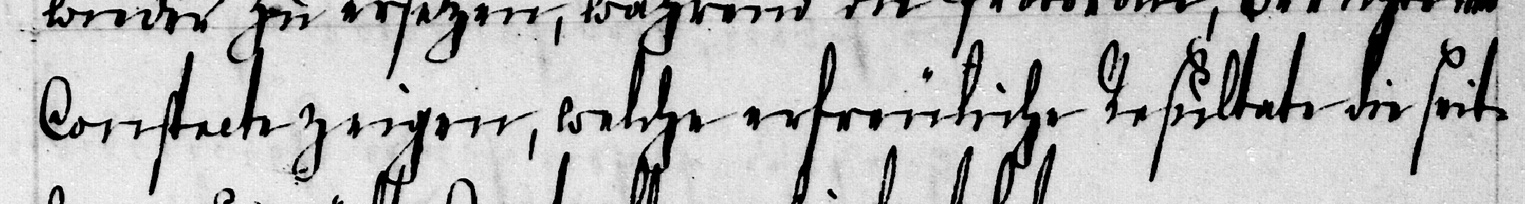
Conspecte zeigen, welche erfreuliche Resultate die seit¬
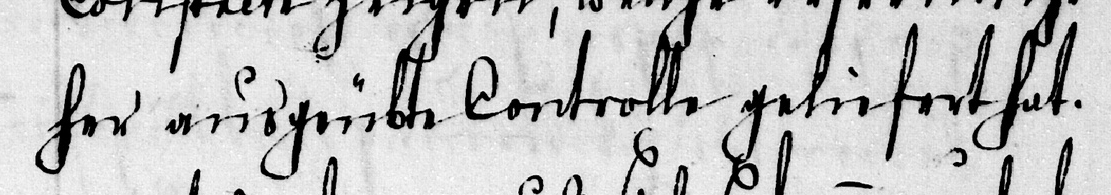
her ausgeübte Controlle geliefert hat.
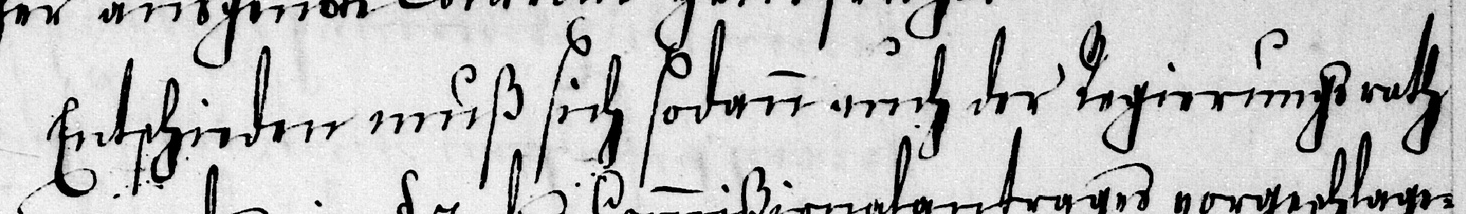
Entschieden muß sich sodann auch der Regierungsrath
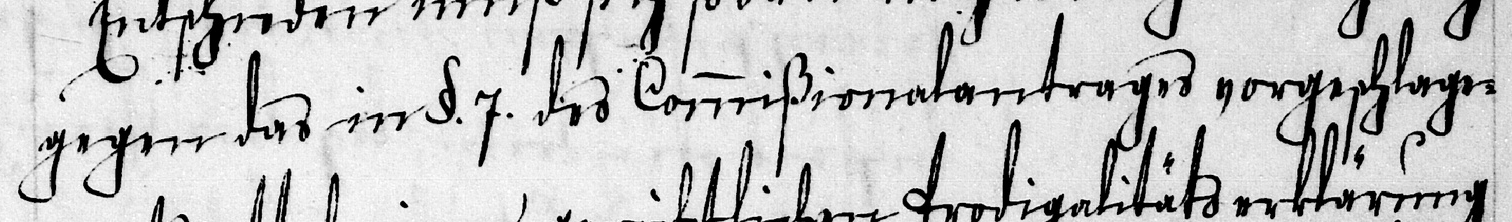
gegen das in §. 7. des Commißionalantrages vorgeschlage¬
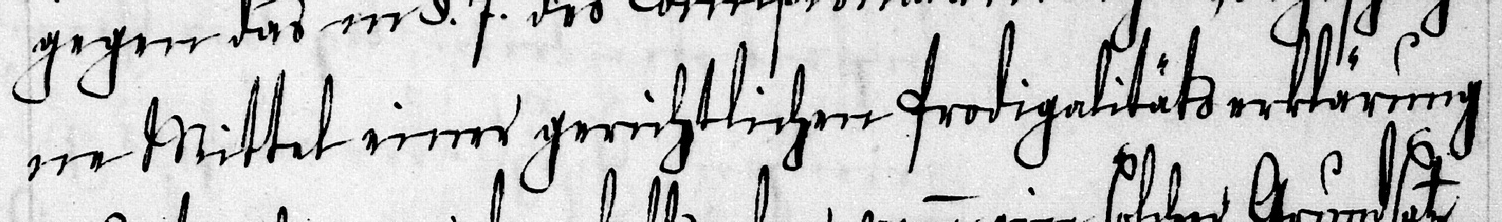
ne Mittel einer gerichtlichen Prodigalitätserklärung
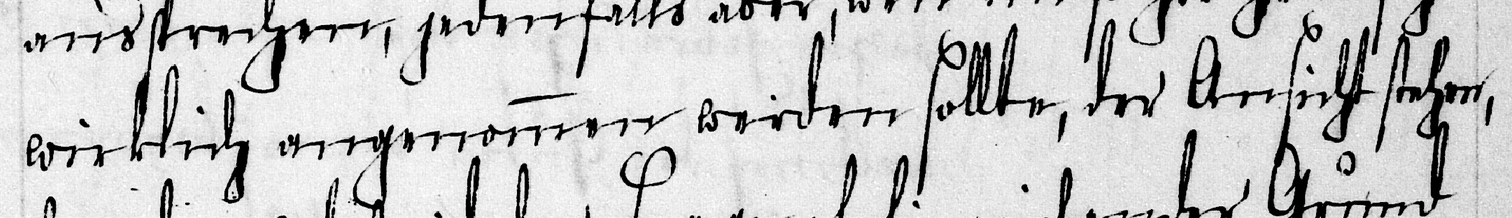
wirklich angenommen werden sollte, der Ansicht ste¬
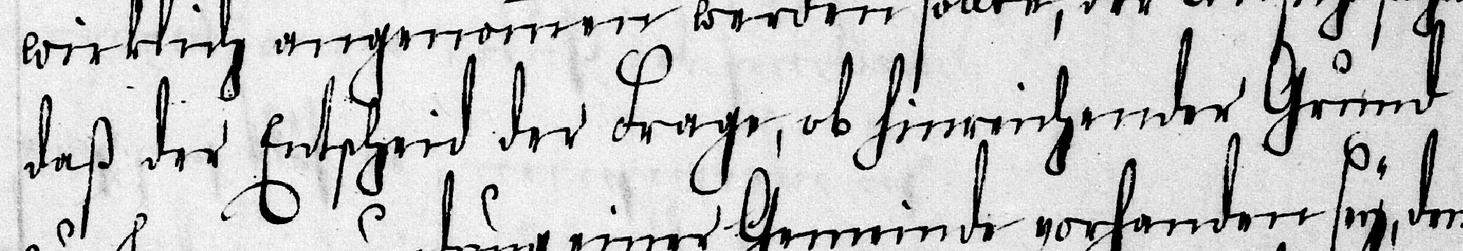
daß der Entscheid der Frage, ob hinreichender Grund
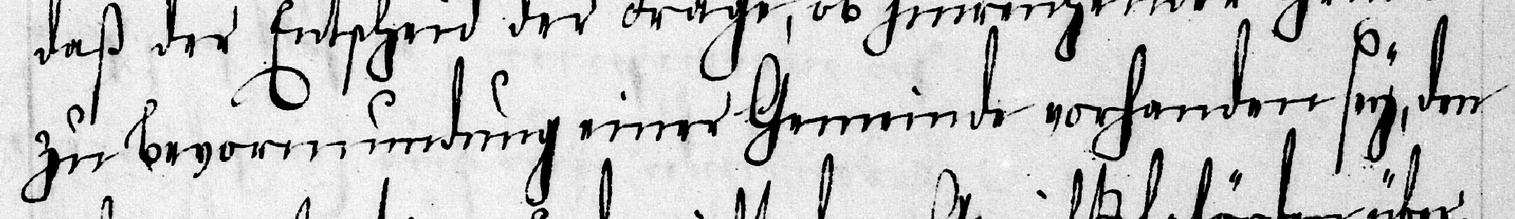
zu Bevormundung einer Gemeinde vorhanden sey, den
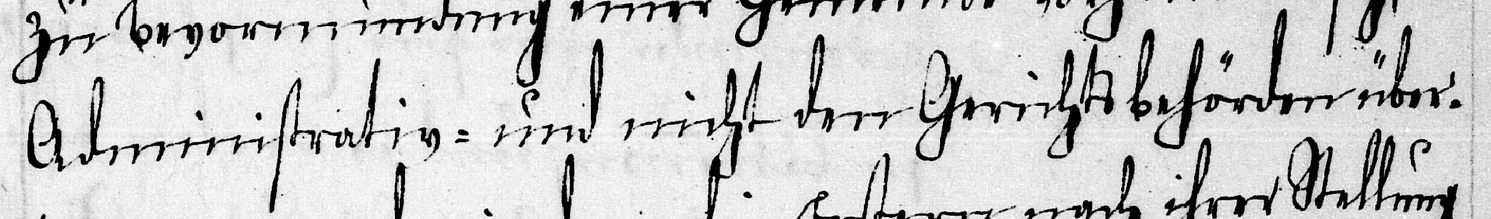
Administrativ- und nicht den Gerichtsbehörden über¬
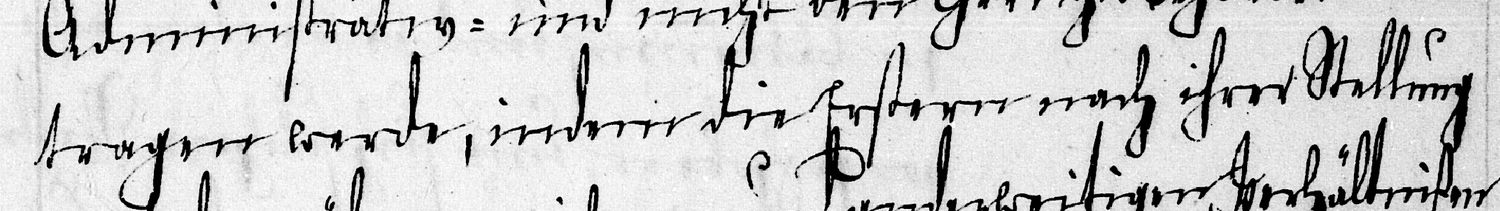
tragen werde, indem die Erstern nach ihrer Stellung
